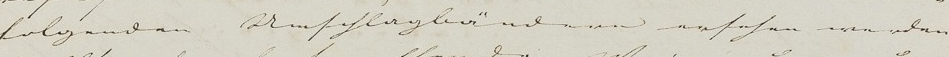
folgenden Umschlagbändern ersehen werden.
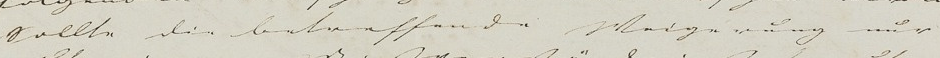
Sollte die betreffende Weigerung nur
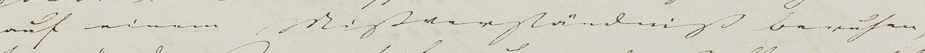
auf einem Mißverständniß beruhen,
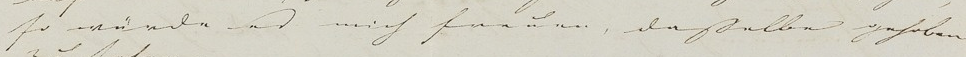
so würde es mich freuen, dasselbe gehoben
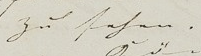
zu sehen.
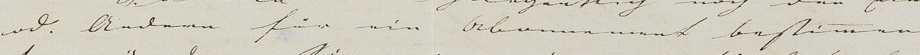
od. Andern für ein Abonnement bestimmen,
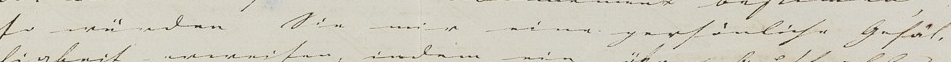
so würden Sie mir eine persönliche Gefäl-
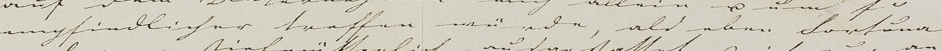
empfindlicher treffen würde, als eben Fortuna
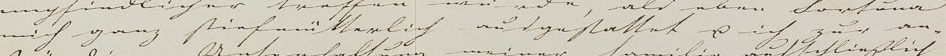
mich ganz stiefmütterlich ausgestattet & ich zur an-
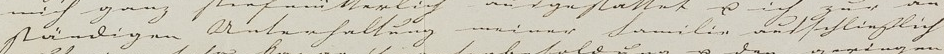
ständigen Unterhaltung meiner Familie ausschließlich
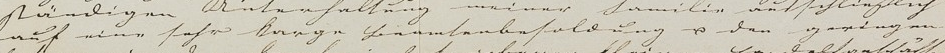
auf eine sehr karge Beamtenbesoldung & den geringen
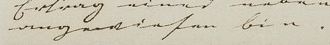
angewiesen bin.
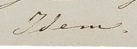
Idem.
